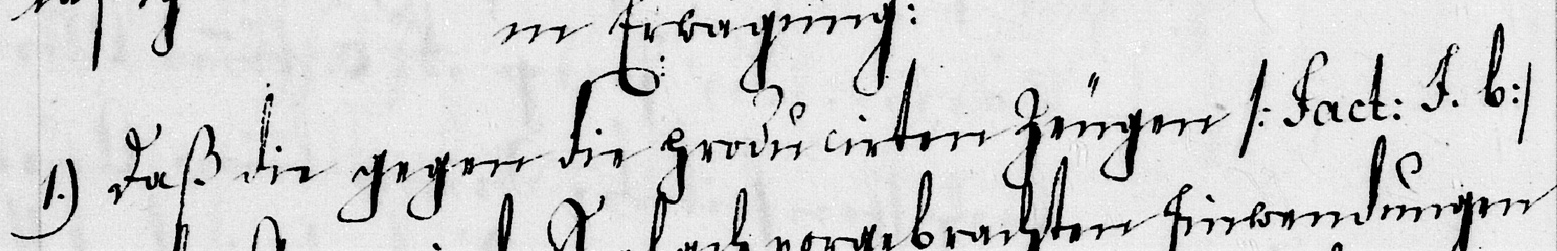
1.) Daß die gegen die producirten Zeugen [Fact: I. b.]
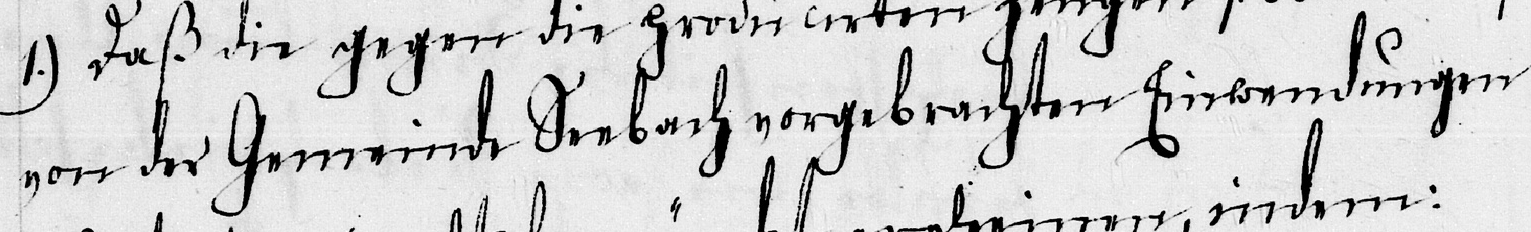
von der Gemeinde Seebach vorgebrachten Einwendungen
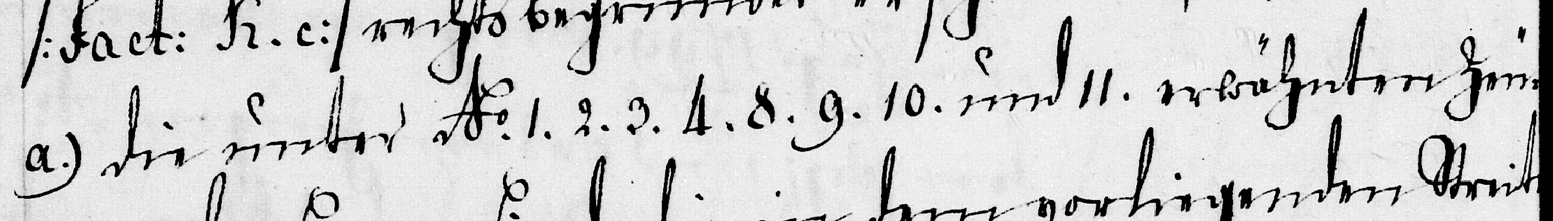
a.) die unter No. 1. 2. 3. 4. 8. 9. 10. und 11. erwähnten Zeu¬
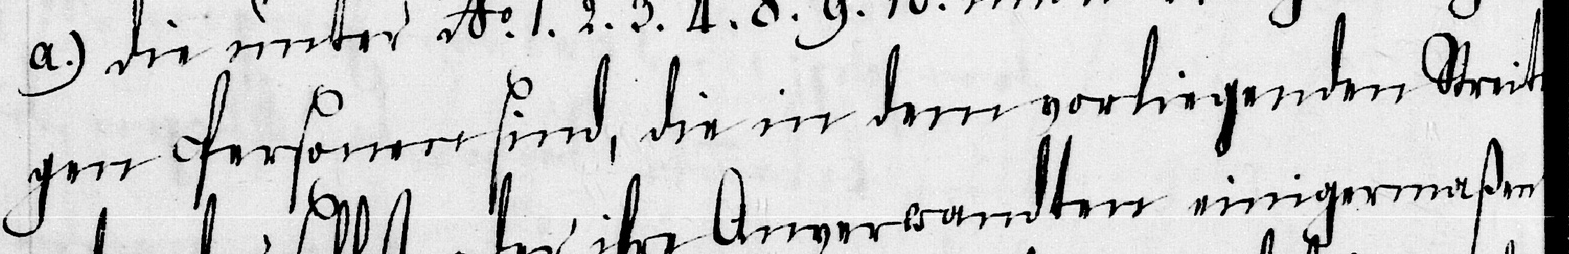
gen Personen sind, die in dem vorliegenden Streite
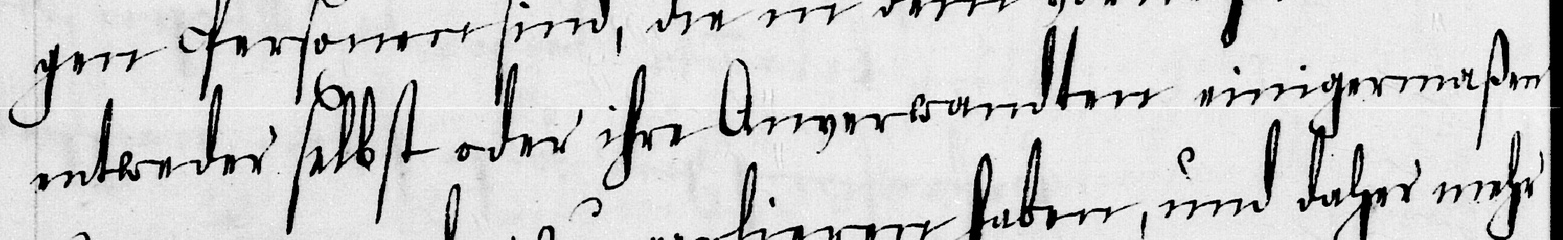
entweder selbst oder ihre Anverwandten einigermaßen
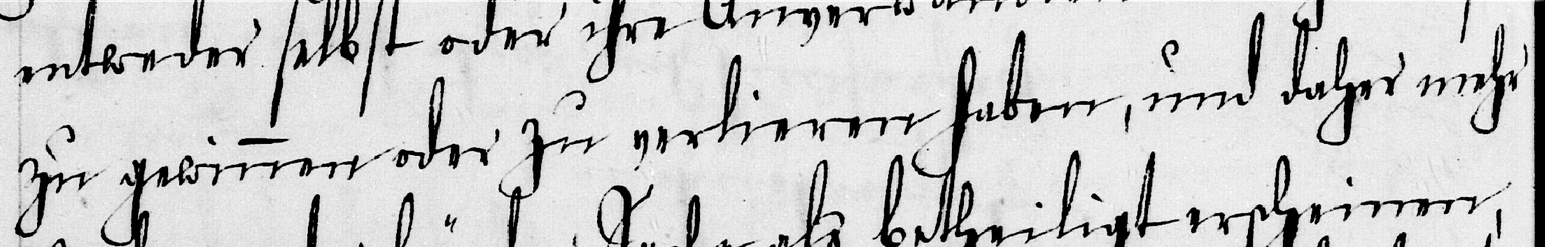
zu gewinnen oder zu verlieren haben, und daher mehr
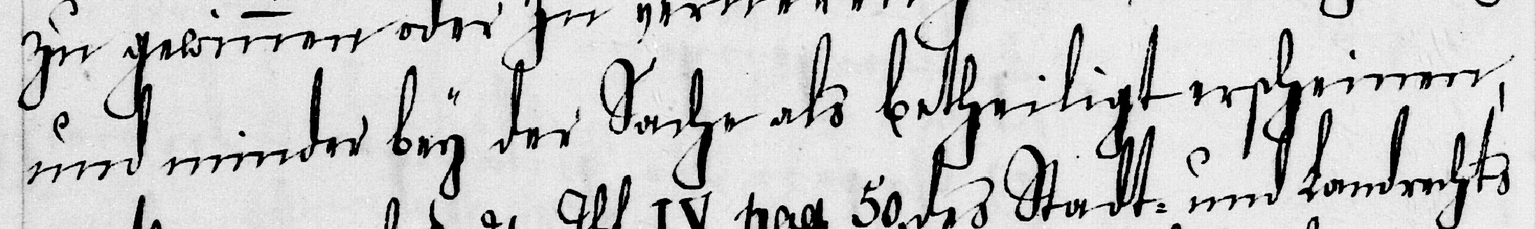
und minder bey der Sache als betheiligt erscheinen,
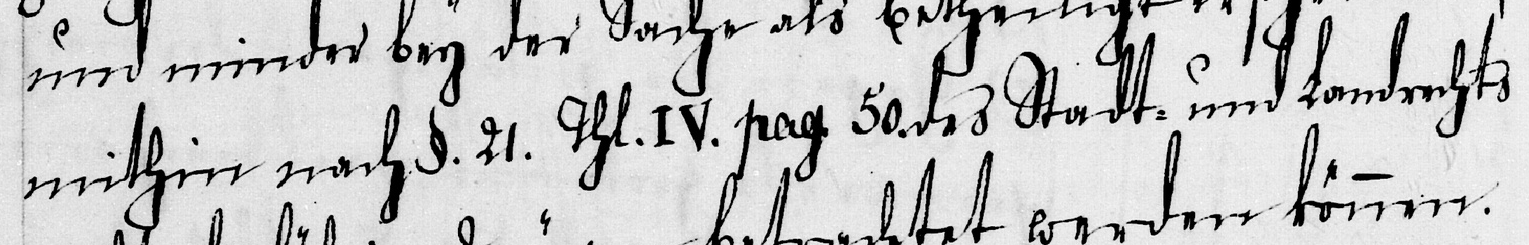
mithin nach §.21. Thl. IV. pag. 50. des Stadt- und Landrechts
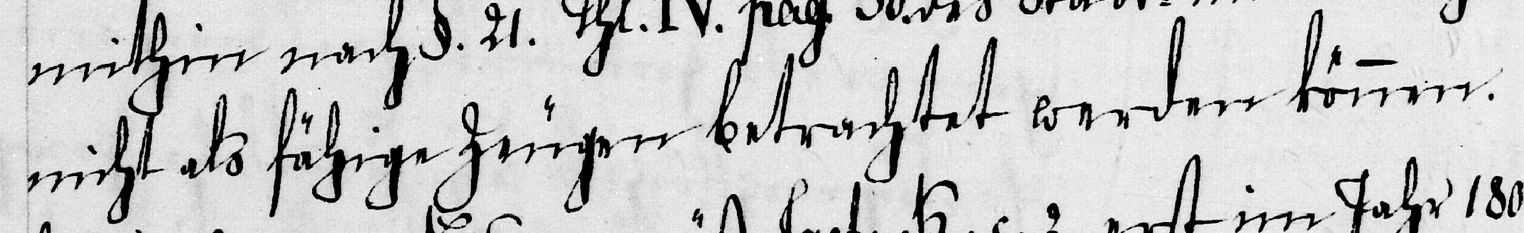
nicht als fähige Zeugen betrachtet werden können.
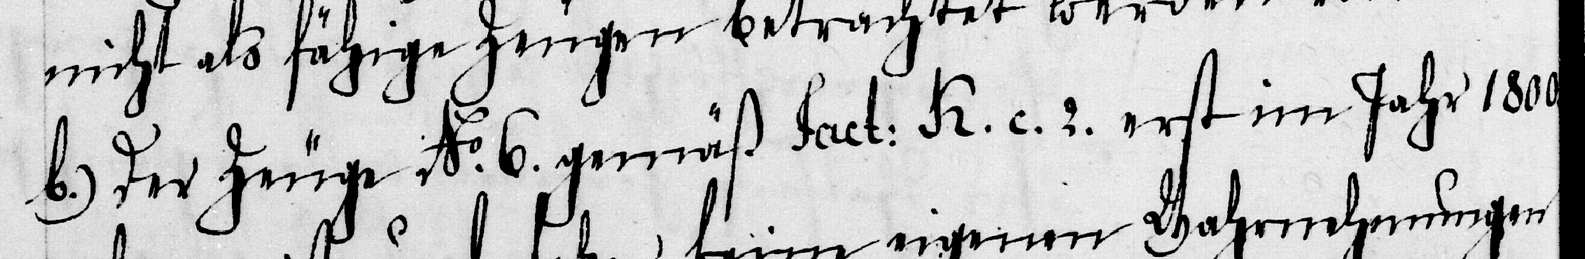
b.) Der Zeuge No. 6. gemäß Fact: K. c. 2. erst im Jahr 1800.
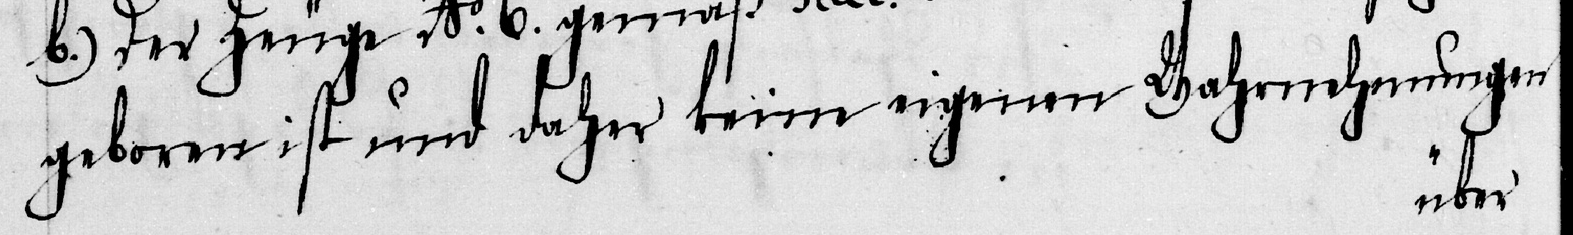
geboren ist und daher keine eigenen Wahrnehmungen
